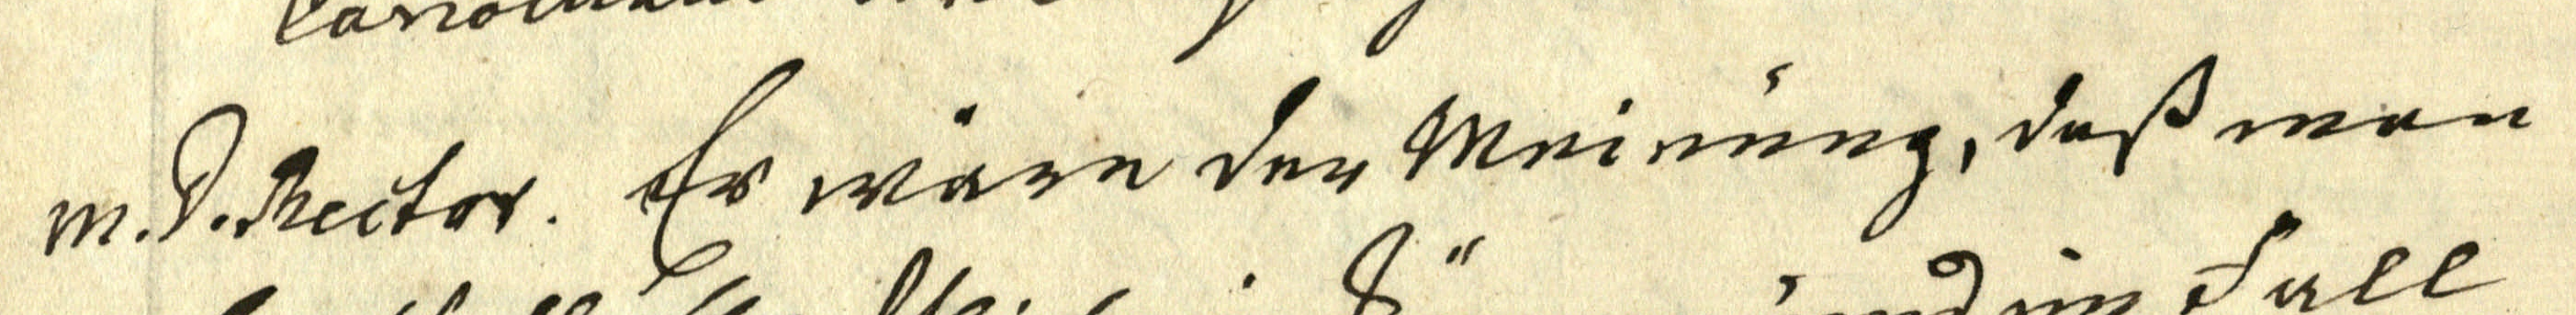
M. D. Rector. Er wäre der Meinung, daß man
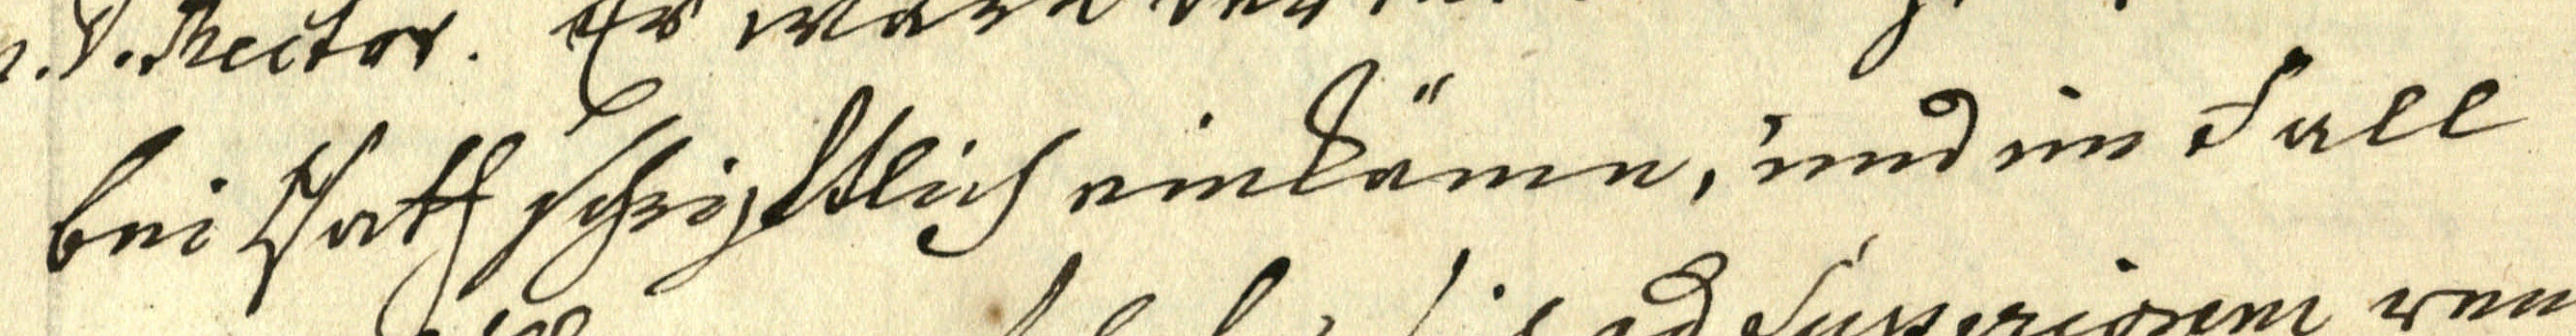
bei Rath schriftlich einkäme, und im Fall
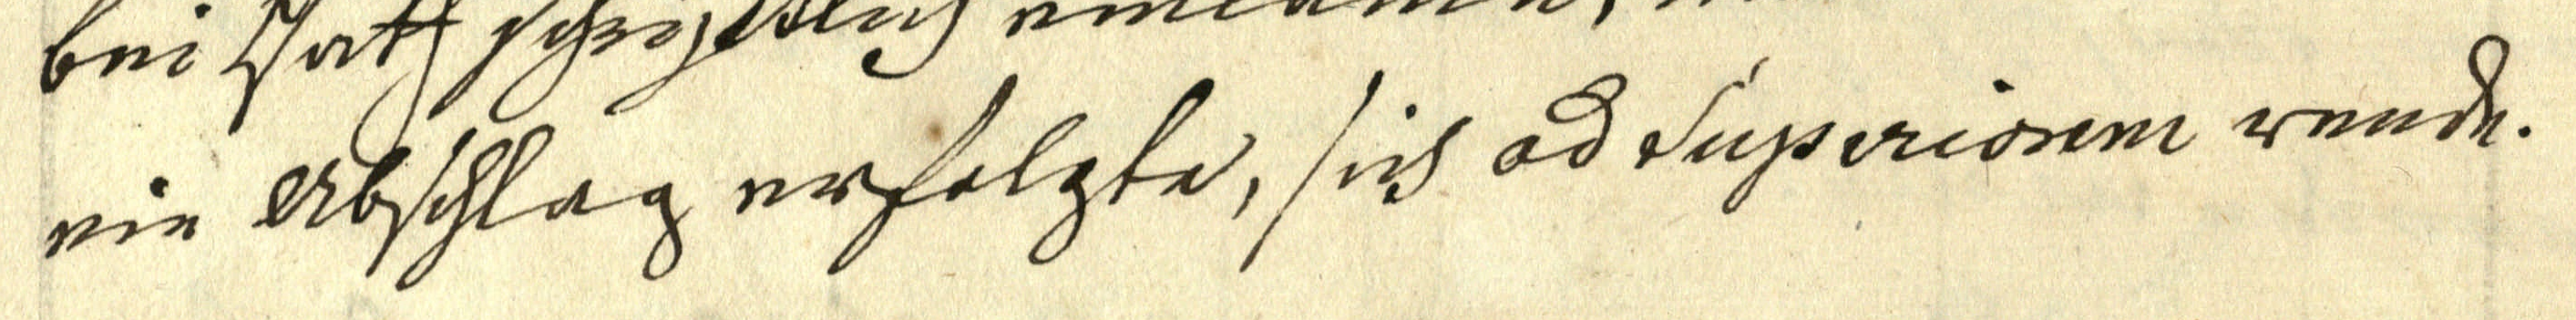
ein Abschlag erfolgte, sich ad Superiorem wende.
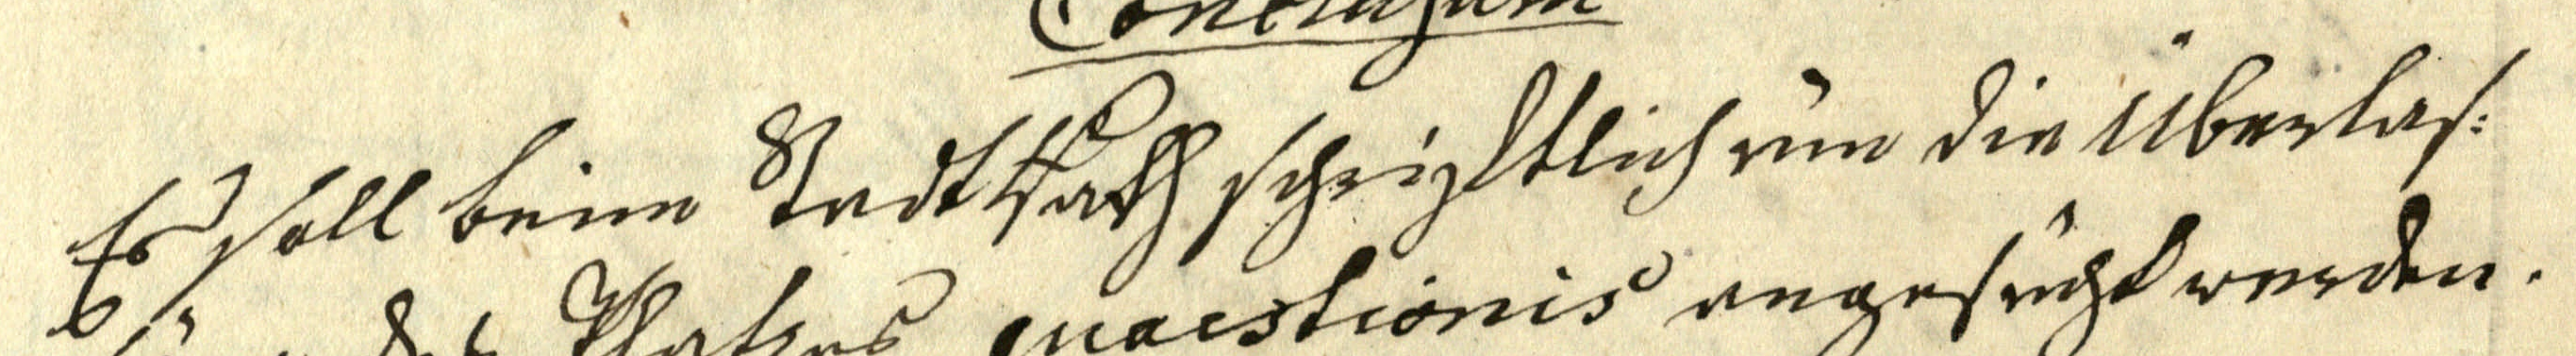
Er soll beim Stadt Rath schriftlich um die Überlas¬
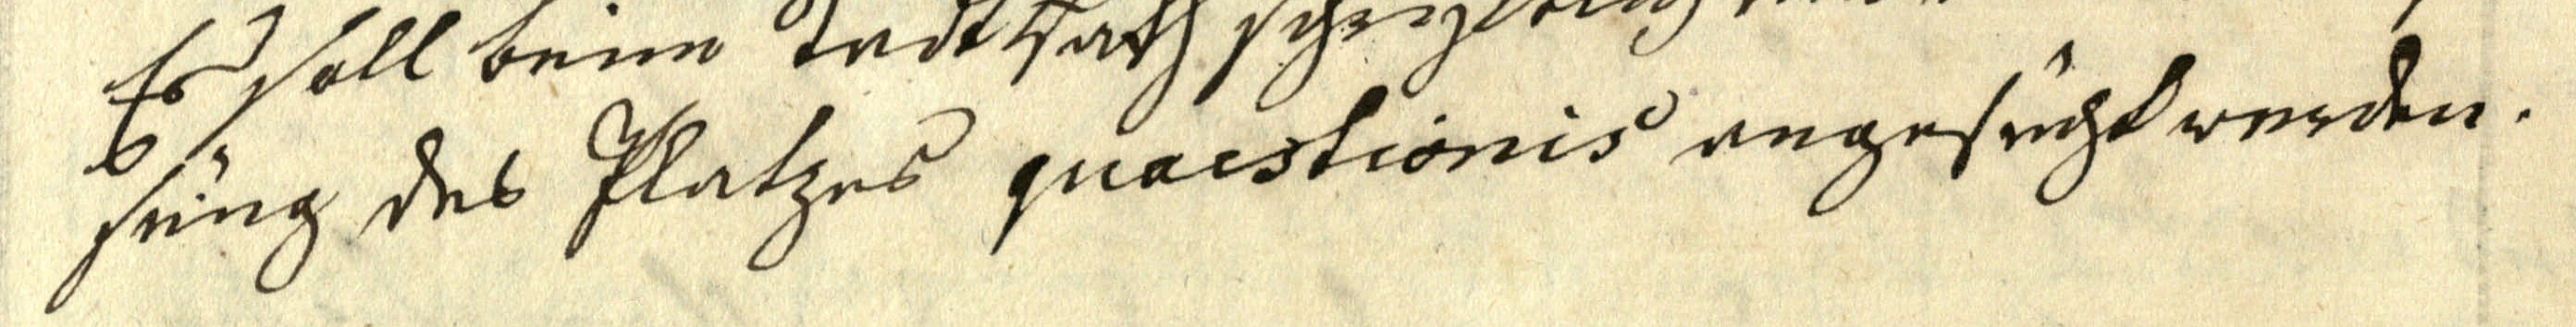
sung des Platzes quaestionis angesucht werden.
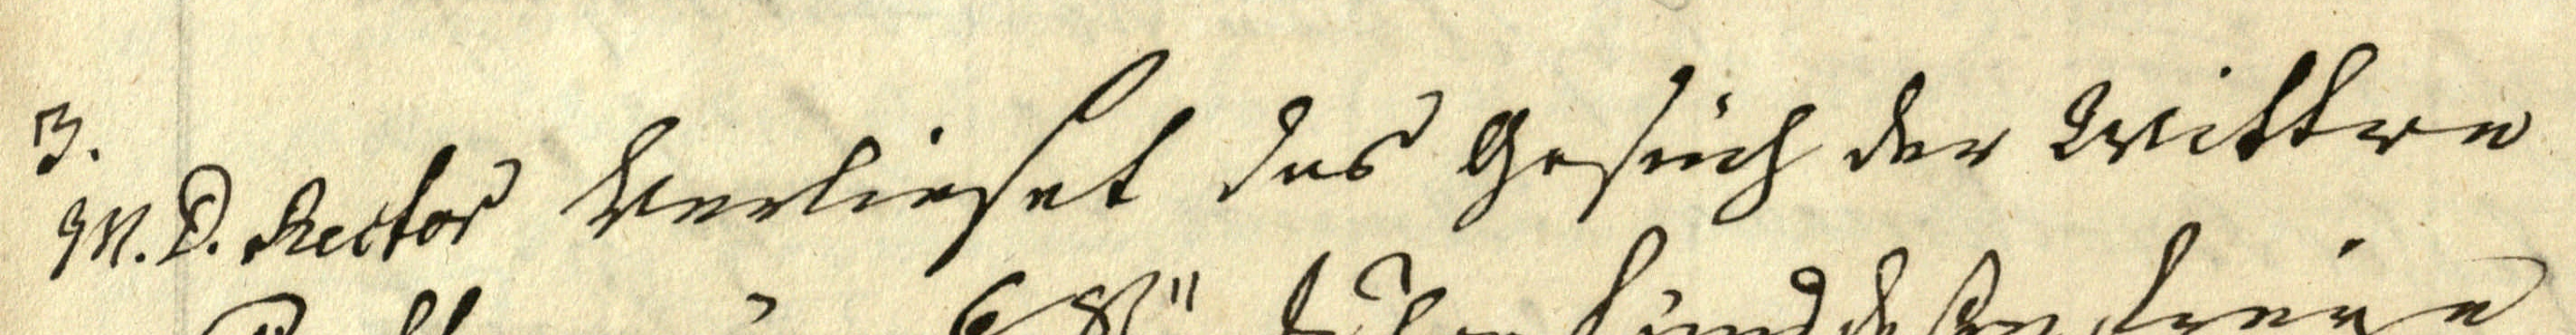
3 M. D. Rector verlieset das Gesuch der Wittwe
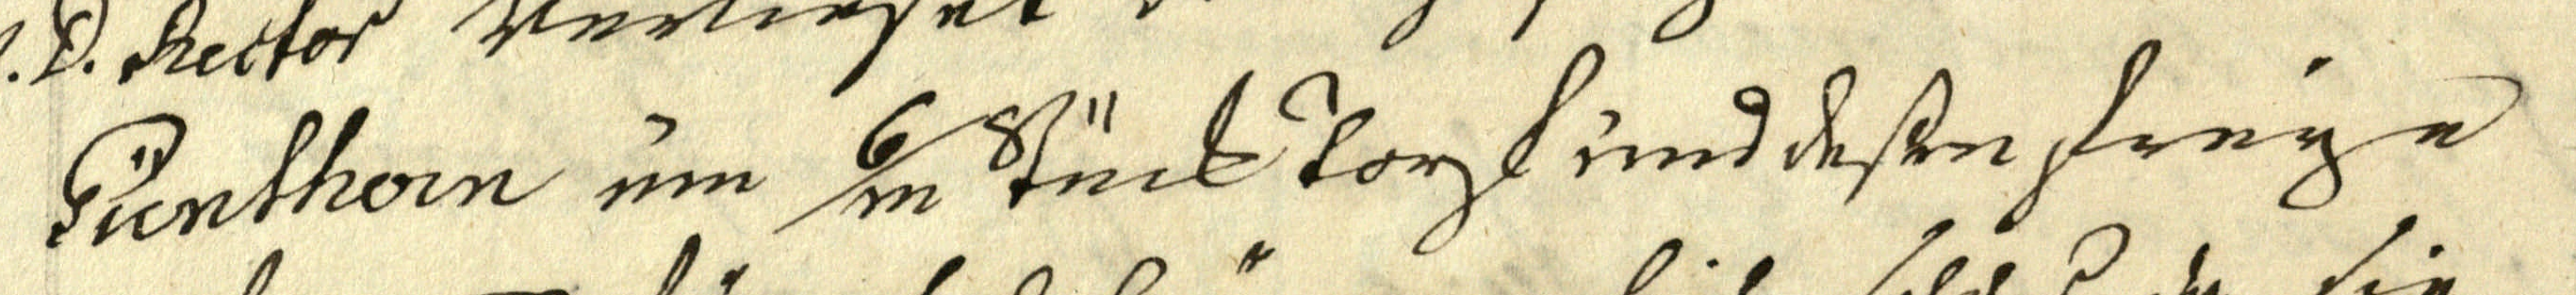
Günthern um 6/m Stück Torf und deßen freÿe
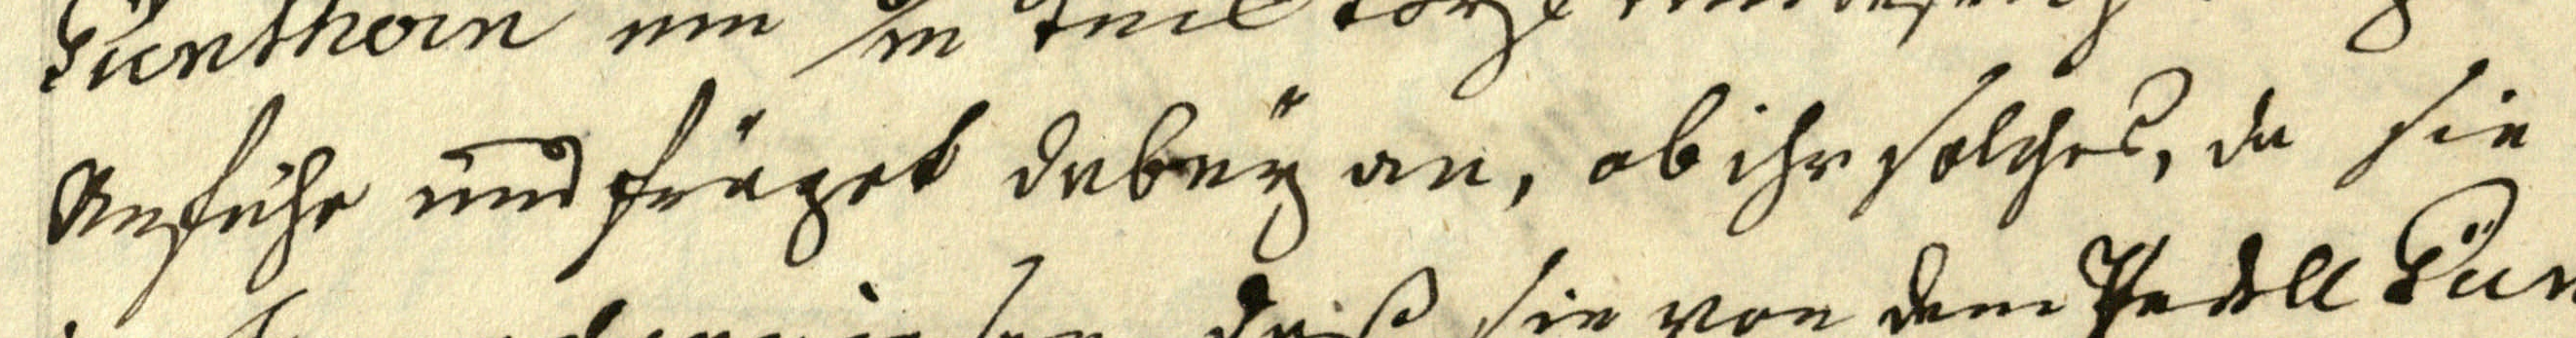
Anfuhr und fräget dabeÿ an, ob ihr solches, da sie
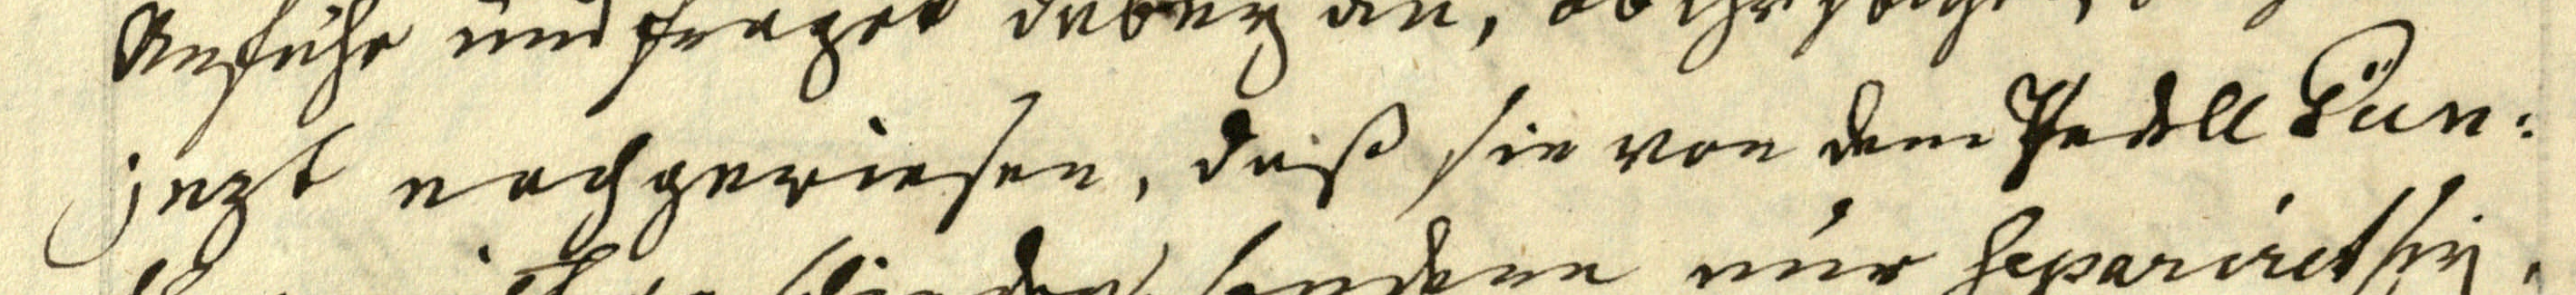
jezt nachgewiesen, daß sie von den Pedellen Gün¬
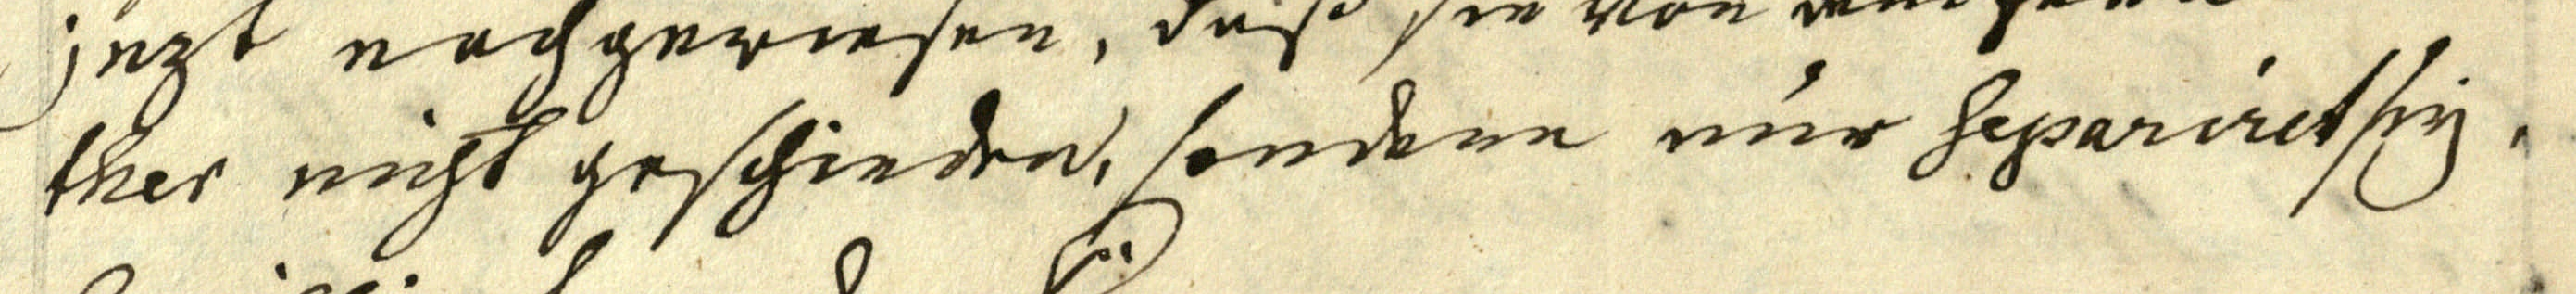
ther nicht geschieden, sondern nur separiret seÿ,
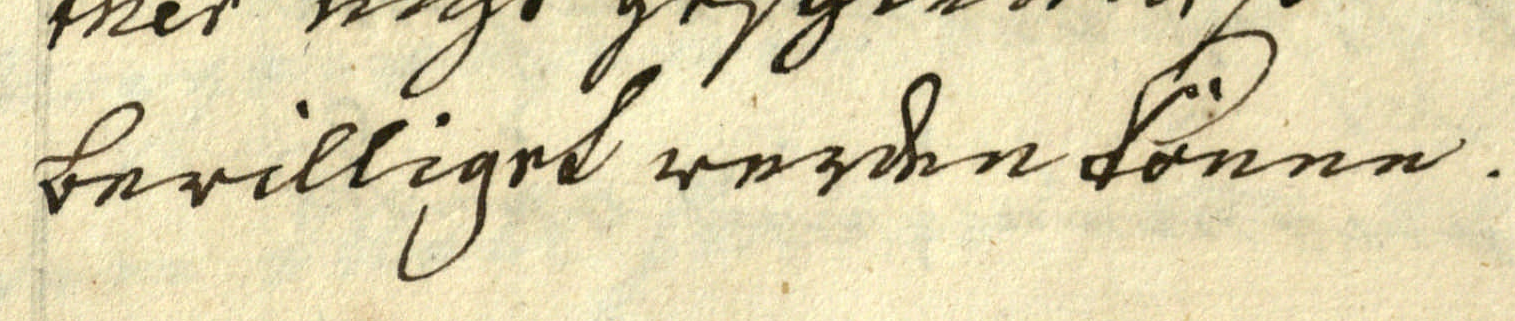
bewilliget werden könne.
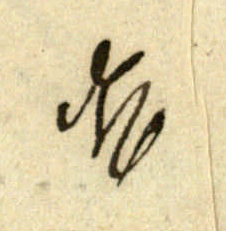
dh
